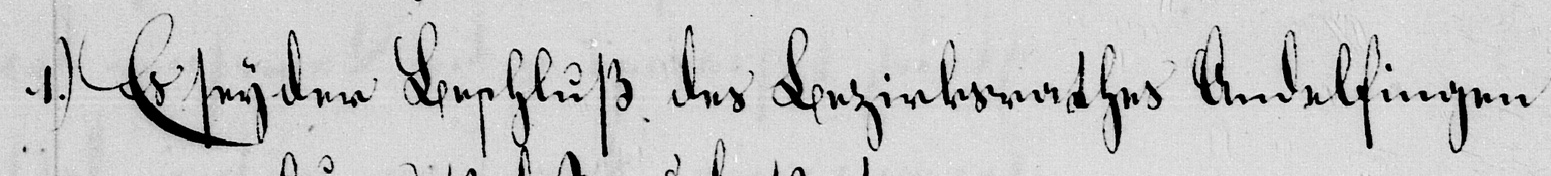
1.) Es sey der Beschluß des Bezirksrathes Andelfingen
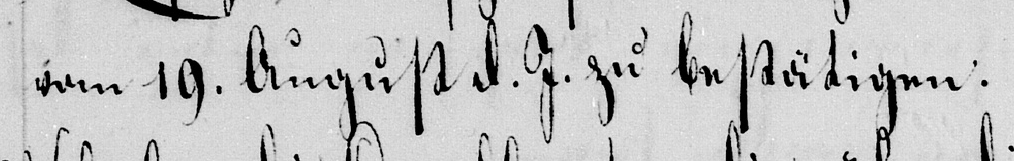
vom 19. August d. J. zu bestätigen.
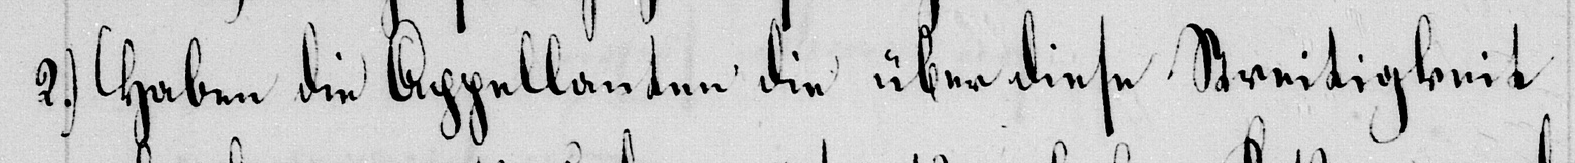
2.) Haben die Appellanten die über diese Streitigkeit
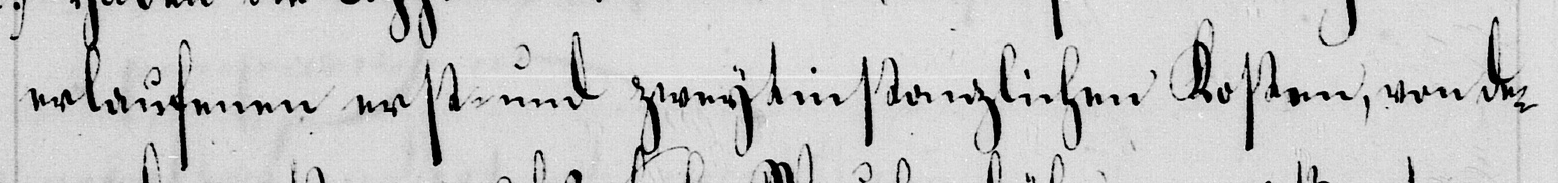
erlaufenen erst- und zweytinstanzlichen Kosten, von de¬
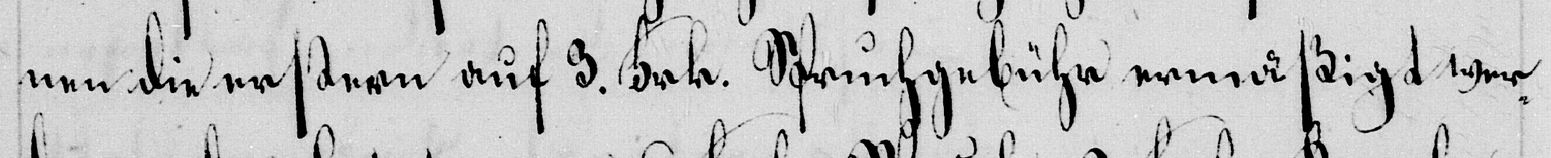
nen die erstern auf 3. Frk. Spruchgebühr ermäßigt wer¬
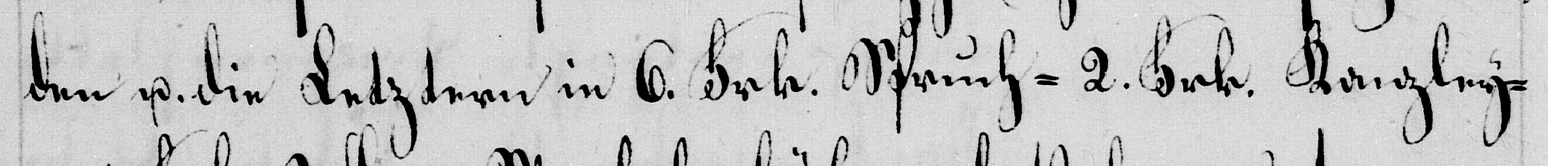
den u. die Letztern in 6. Frk. Spruch- 2. Frk. Kanzley-
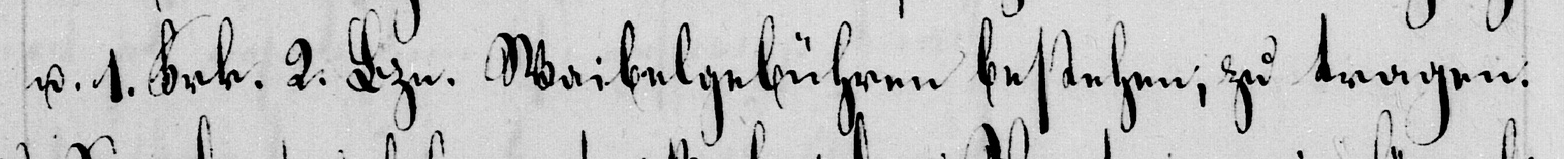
u. 1. Frk. 2. Bzn. Waibelgebühren bestehen, zu tragen.
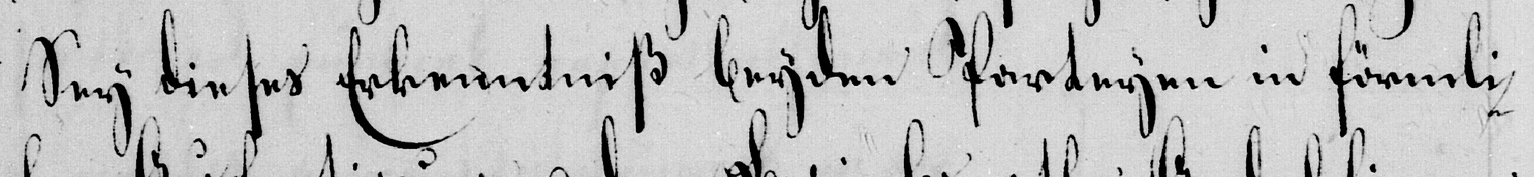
Sey dieses Erkenntniß beyden Parteyen in förmli¬
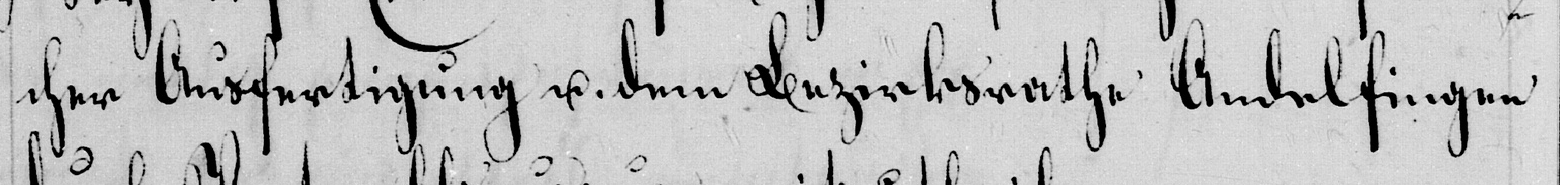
cher Ausfertigung u. dem Bezirksrathe Andelfingen
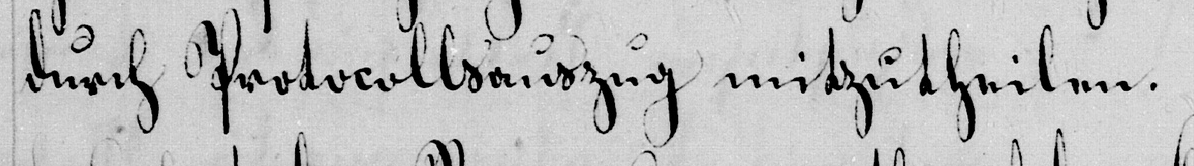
durch Protokollsauszug mitzutheilen.
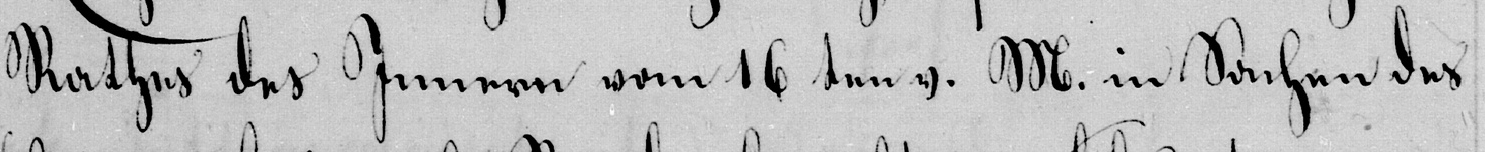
Rathes des Innern vom 16ten v. M. in Sachen des
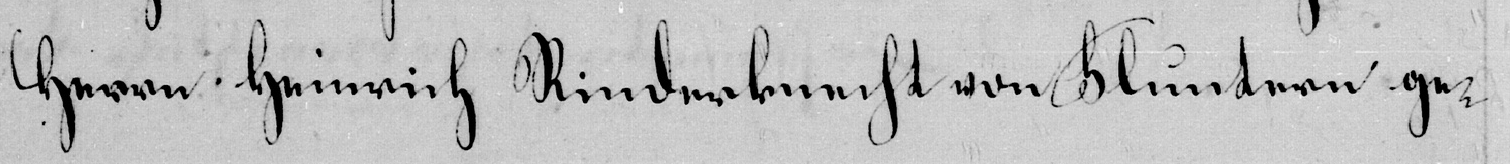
Herrn Heinrich Rinderknecht von Fluntern ge-
